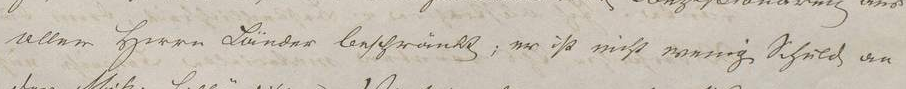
aller Herrn Länder beschränkt; er ist nicht wenig Schuld an
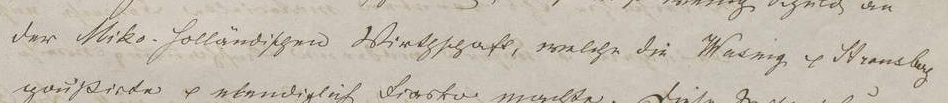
der Miko–holländischen Wirthschaft, welche die Wasnig & Strausberg
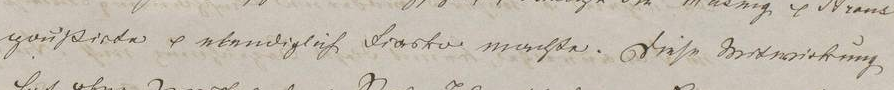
poußirte & elendiglich Fiasko machte. Diese Mitwirkung
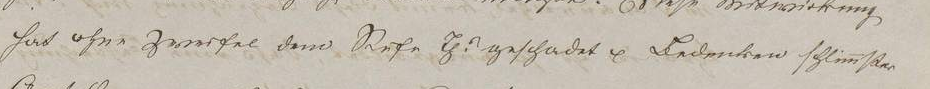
hat ohne Zweifel dem Rufe Ths geschadet & Bedenken schlimmster
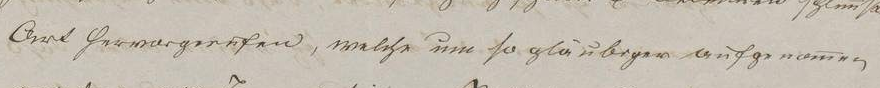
Art hervorgerufen, welche um so gläubiger aufgenommen
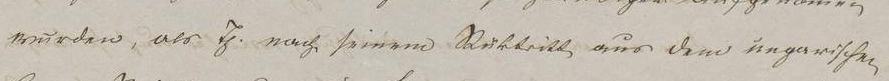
wurden, als Th. nach seinem Rüktritt aus dem ungarischen
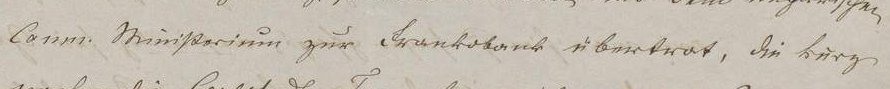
Comm. Ministerium zur Frankobank übertrat, die kurz
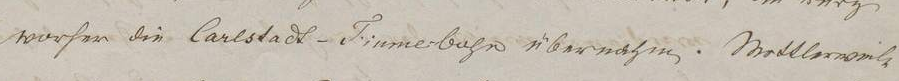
vorher die Carlstadt–Fiumer bahn übernahm. Mittlerweile
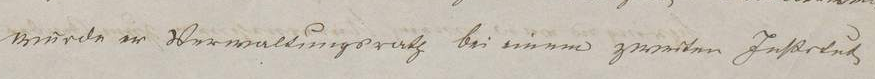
wurde er Verwaltungsrath bei einem zweiten Institut
